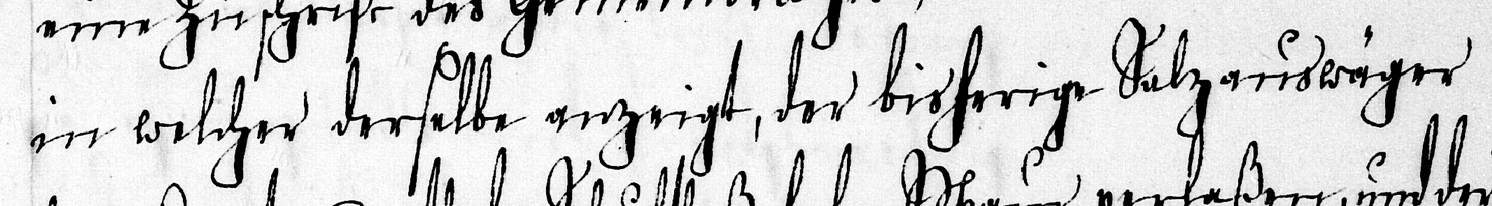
in welcher derselbe anzeigt, der bisherige Salzauswäger
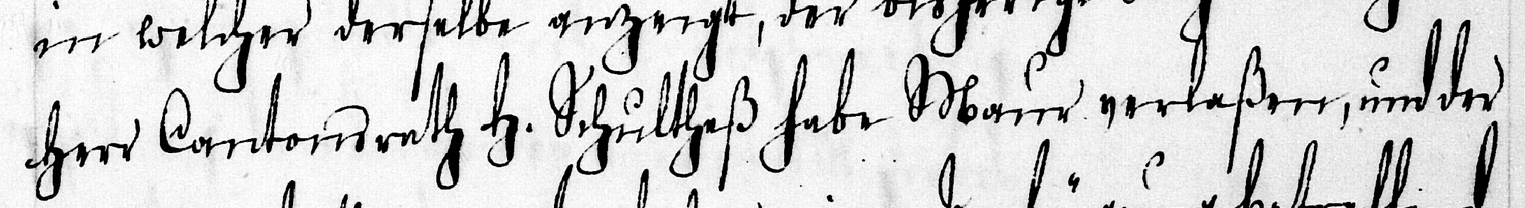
Herr Cantonsrath H. Schlultheß habe Maur verlaßen, und der
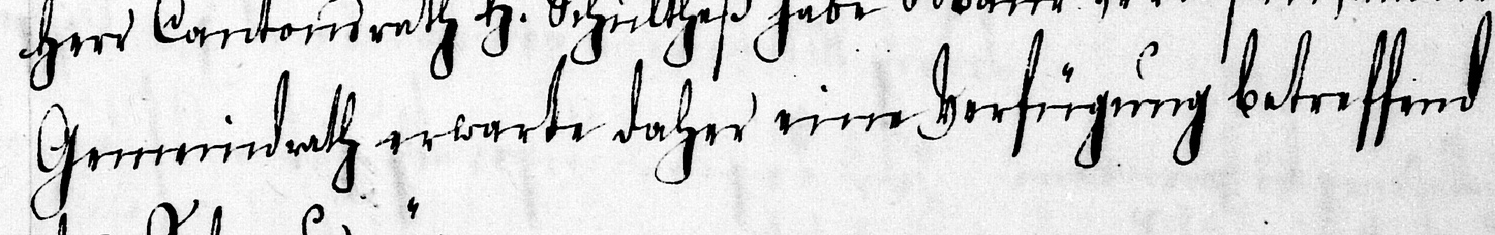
Gemeindrath erwarte daher eine Verfügung betreffend
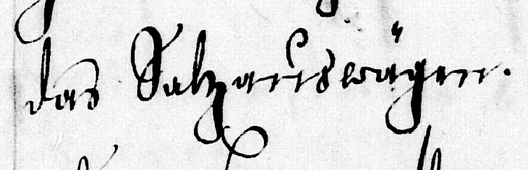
das Salzauswägen.
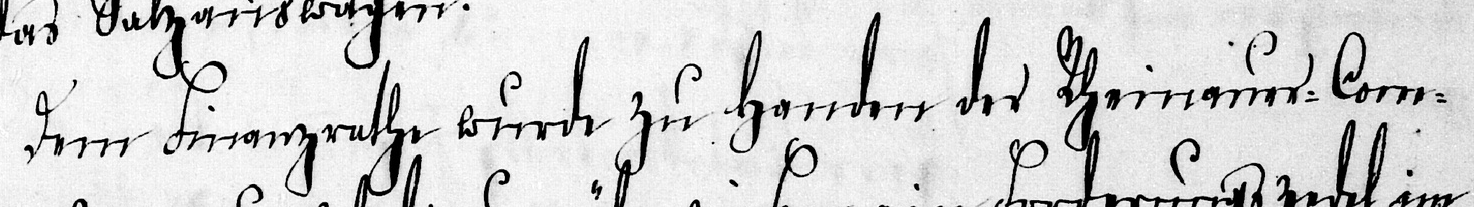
Dem Finanzrathe wurde zu Handen der Rheinauer-Com¬
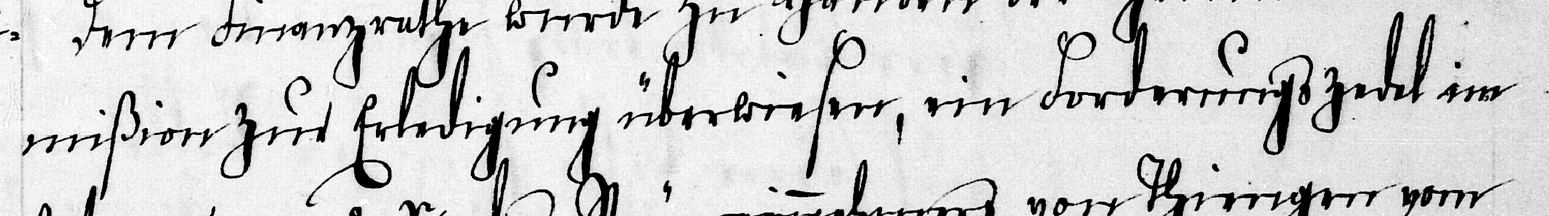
mißion zur Erledigung überwiesen, ein Forderungszedel im
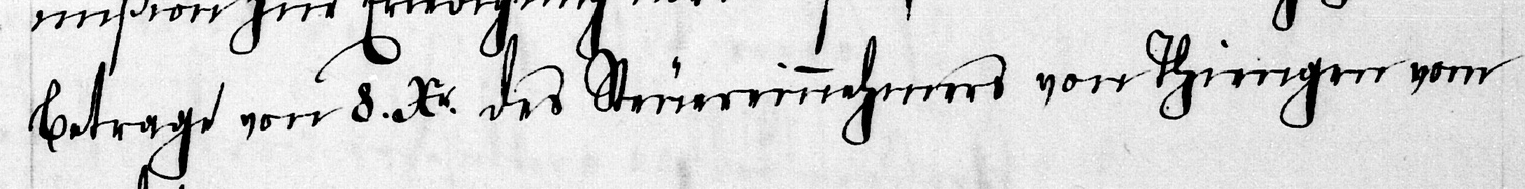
Betrage von 8. Xr. des Steuereinnehmers von Thiengen vom
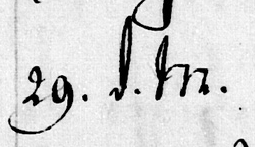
29. d. M.
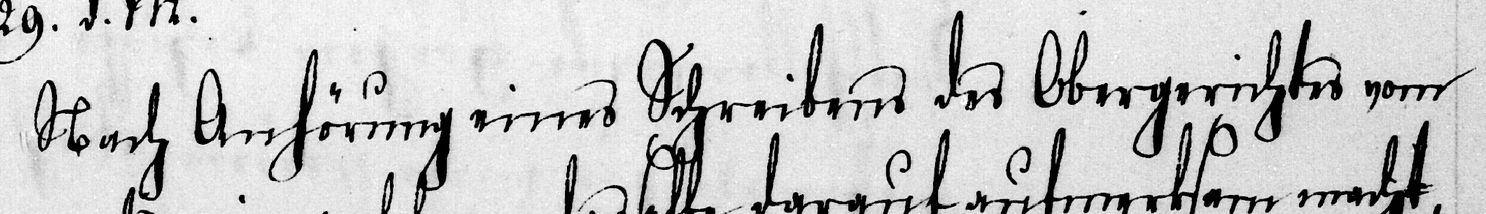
Nach Anhörung eines Schreibens des Obergerichtes vom
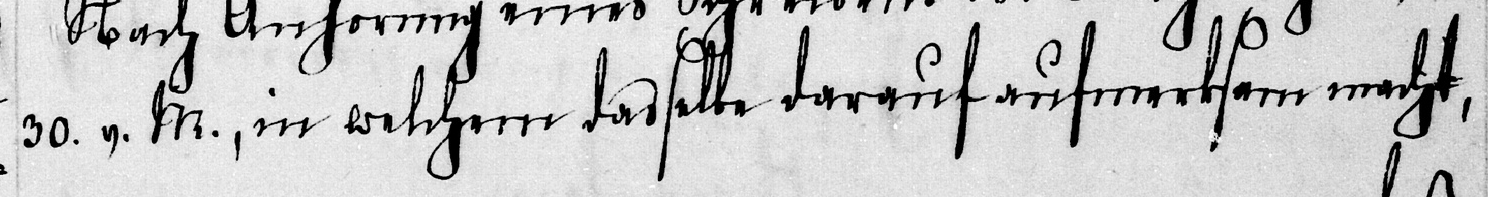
30. v. M., in welchem dasselbe darauf aufmerksam macht,
